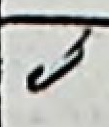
5
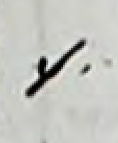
./.
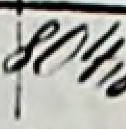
804,8
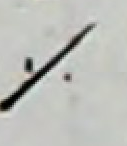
./.
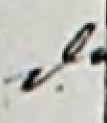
do
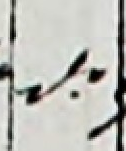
do
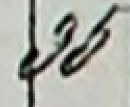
35
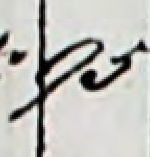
95
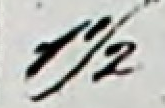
1½
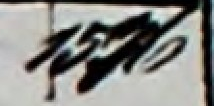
15?6
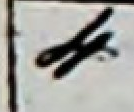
4
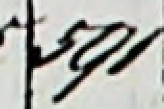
591
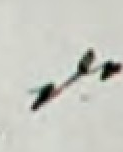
do
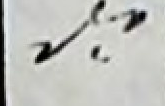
do
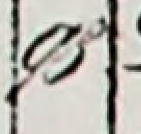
98
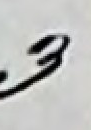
3
